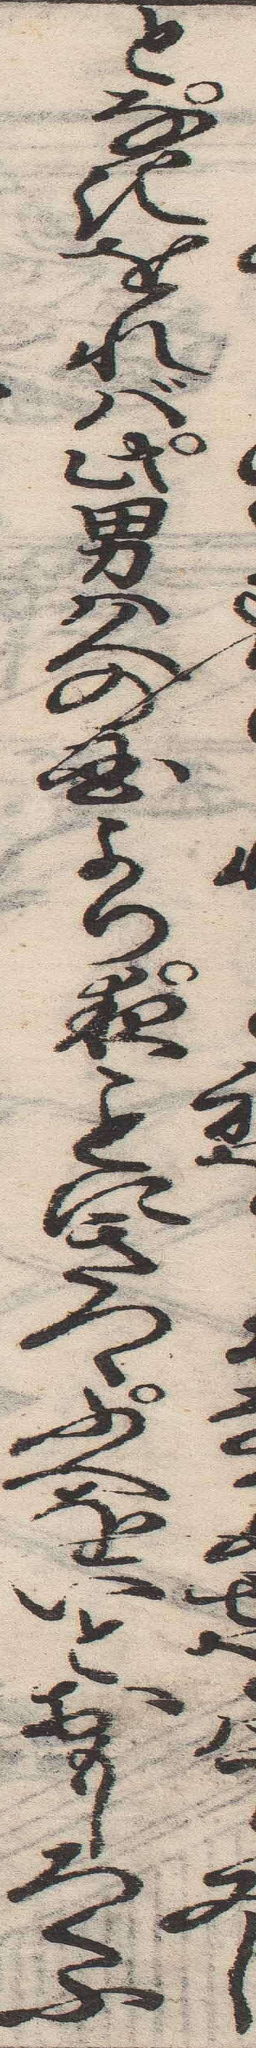と。なきをれば。此男は人の国より。夜ことにきつゝ。ふへをいとおもしろくふ
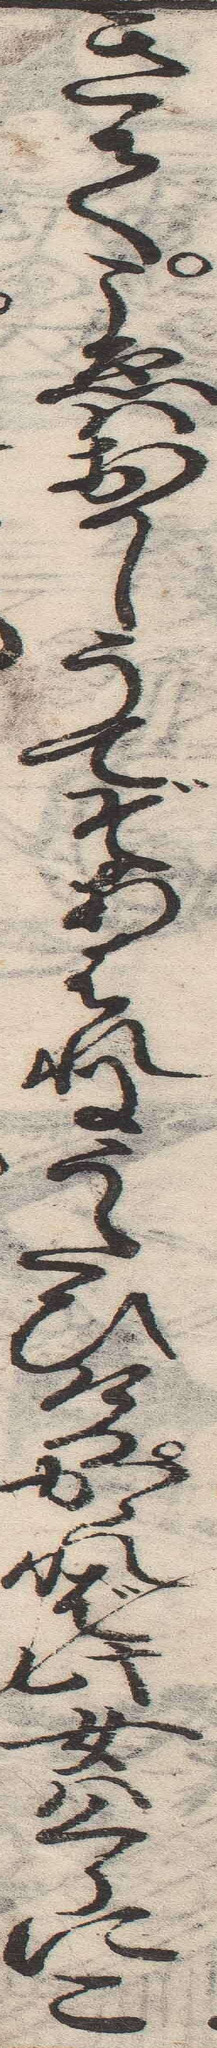きて。こゑはおかしうてぞあはれにうたひける。かゝれば此女はくらにこ
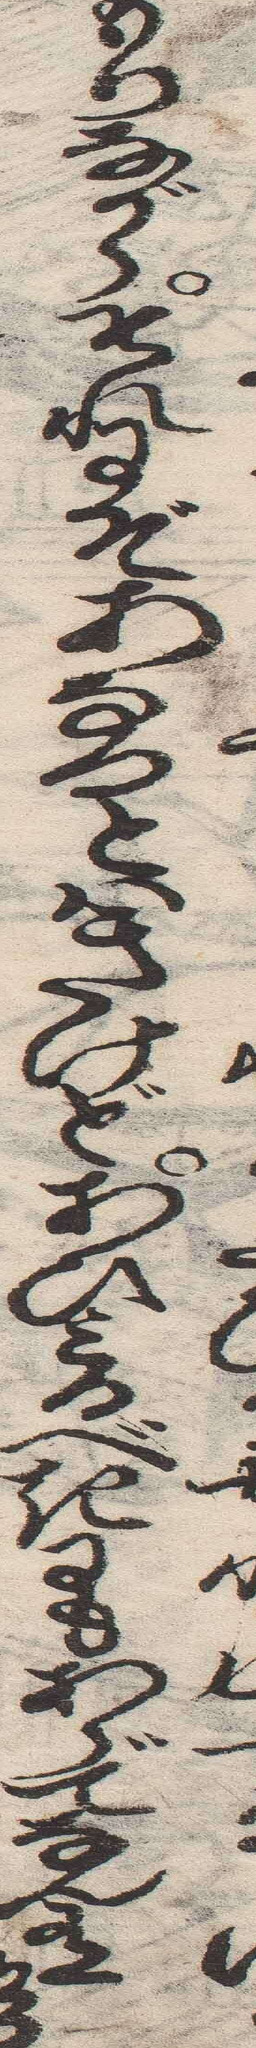もりながら。それにぞあなるとはきけど。あひみるべきにもあらでなん有ける
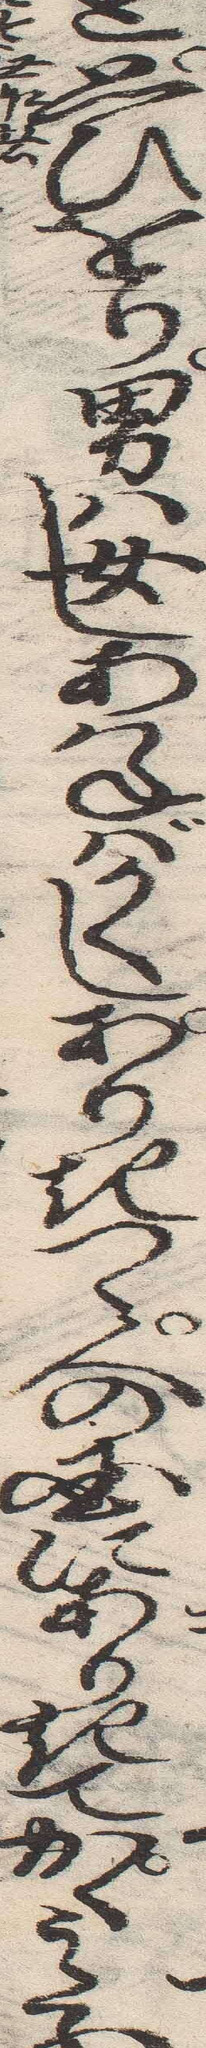と。思ひをり。男は女しあはねばかくし。ありきつゝ。人の国にありきて。かくうたふ
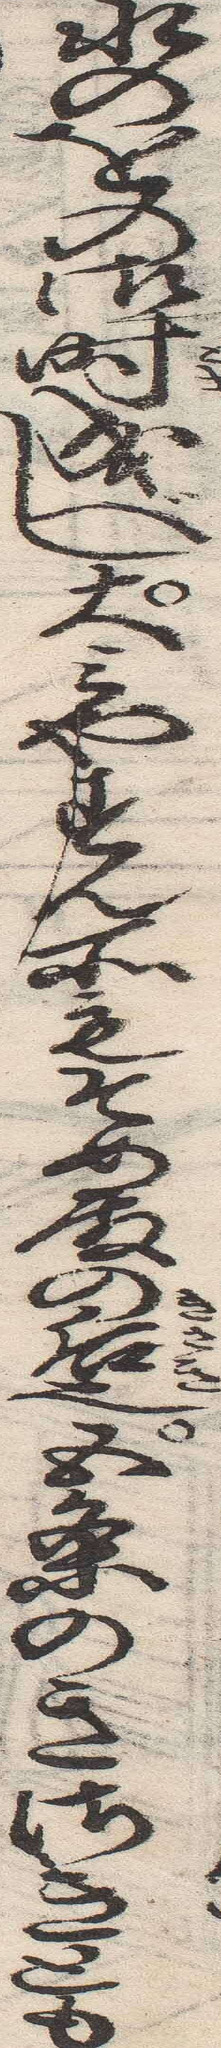水のをの御時成べし。大みやすん所もそめ殿の后也。五条のきさきとも
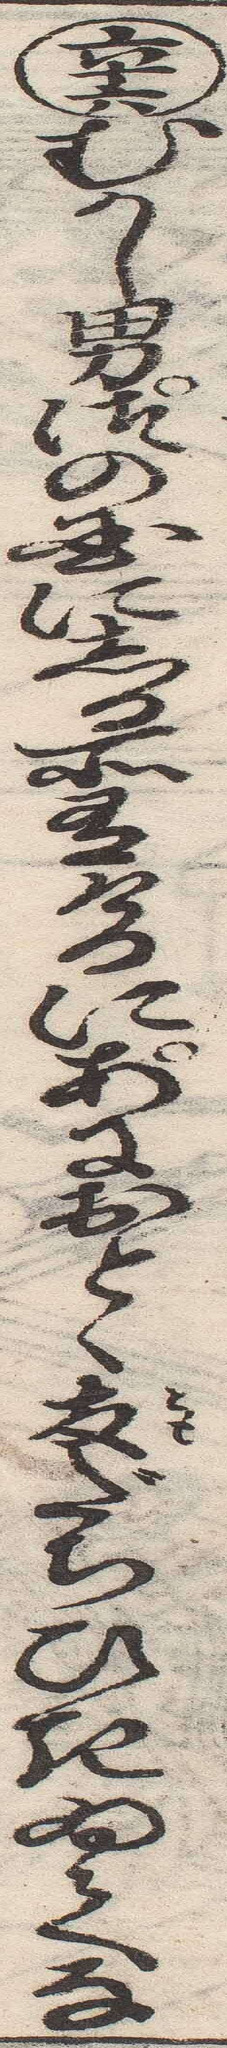六十六むかし男。つの国にしる所有けるに。あにおとゝ友だちひきゐてな
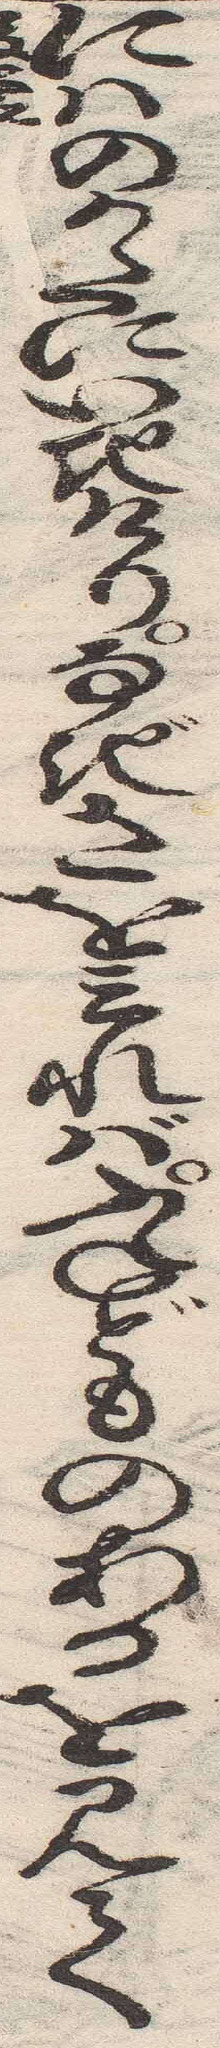にはのかたにいきけり。なぎさをみれば。ふねどものあるを見て
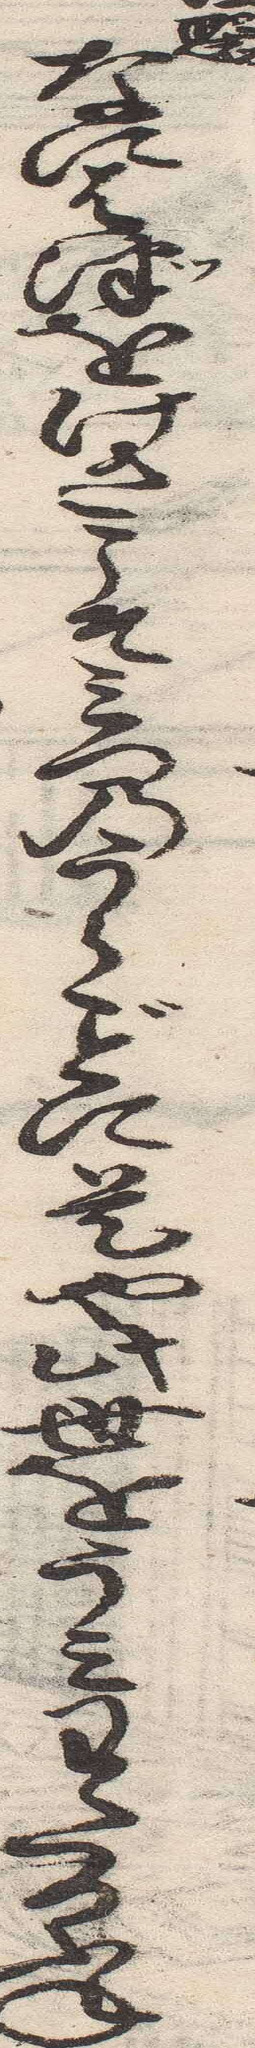後撰なには津をけさこそみつのうらごとに是や此世をうみわたるふね
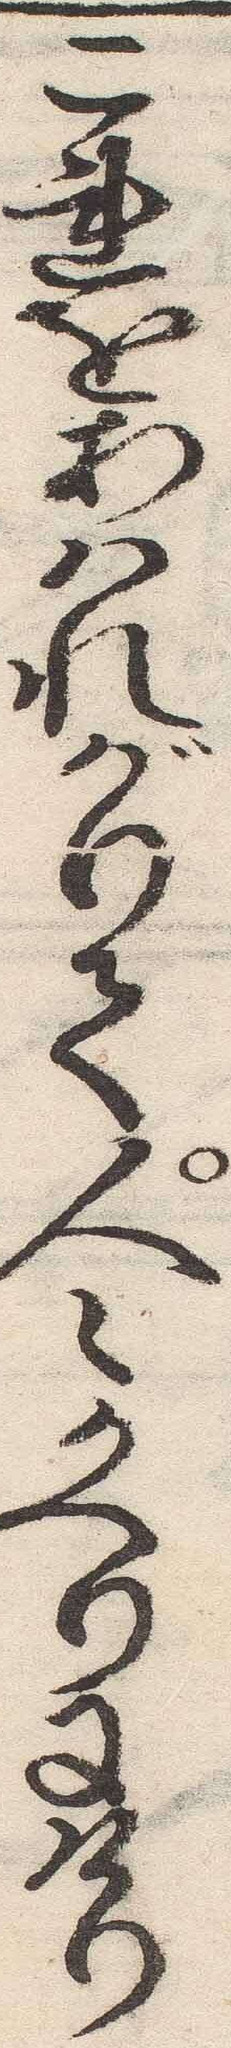これをあはれがりて。人々かへりにけり
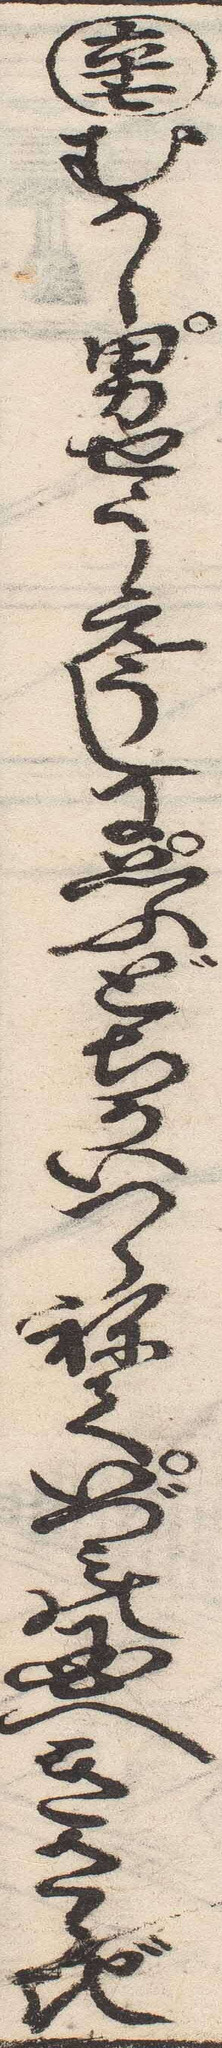六十七むかし。男せうえうしに。思ふどちかいつらねて。いづみの国へきさらぎ
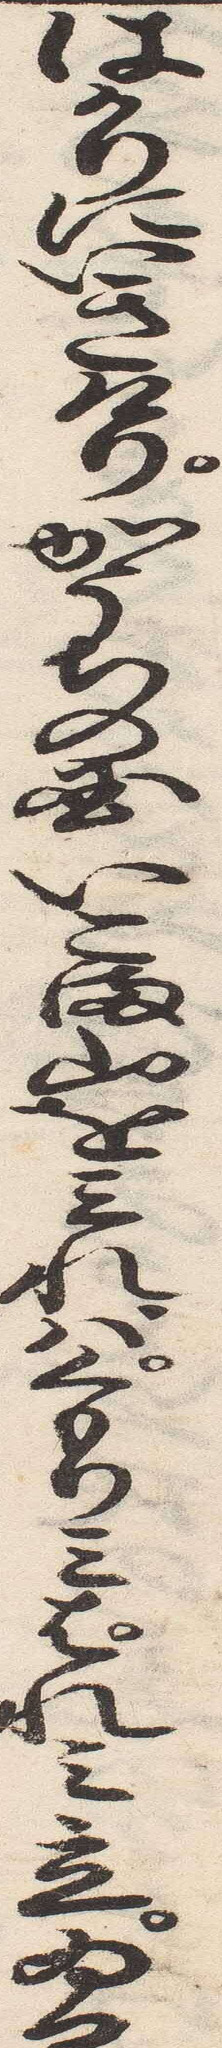はかりにいきけり。かうちの国いこま山をみれば。くもりみ。はれみ立。ゐる
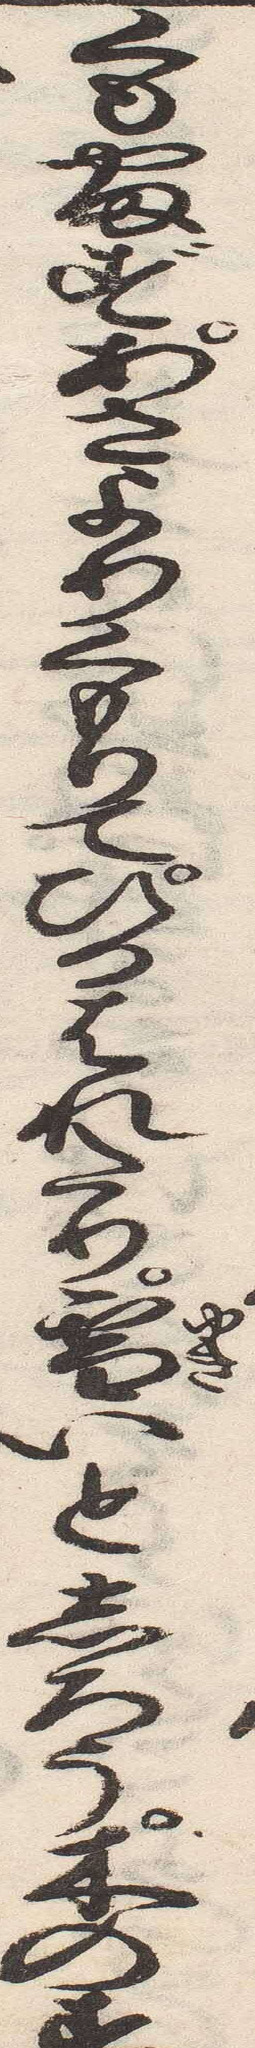くもやまず。あさよりくもりて。ひるはれたり。雪いとしろう。木のす
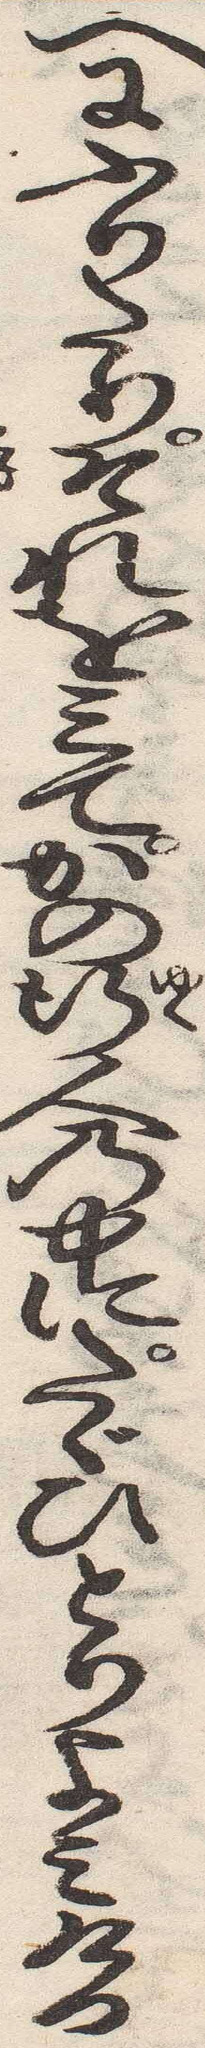へにふりたり。それをみて。かの行人の中に。たゞひとりよみける
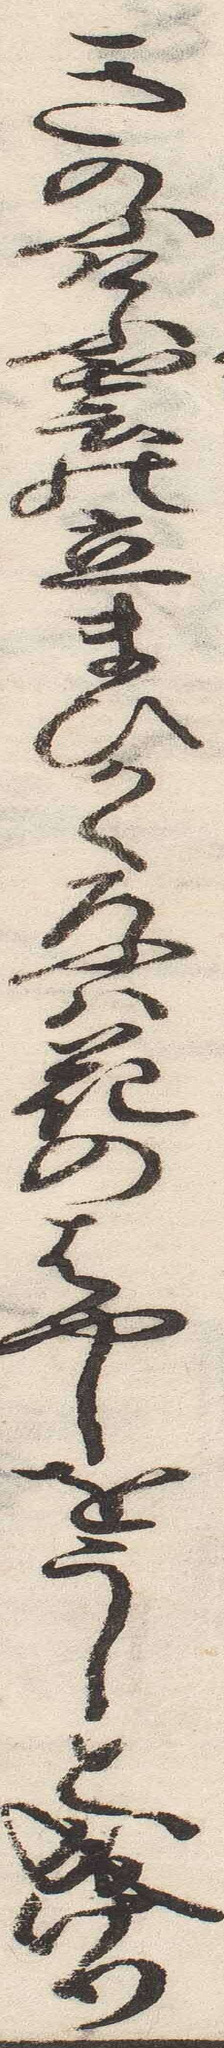きのふけふ雲の立まひかくろふは花のはやしをうしと成けり
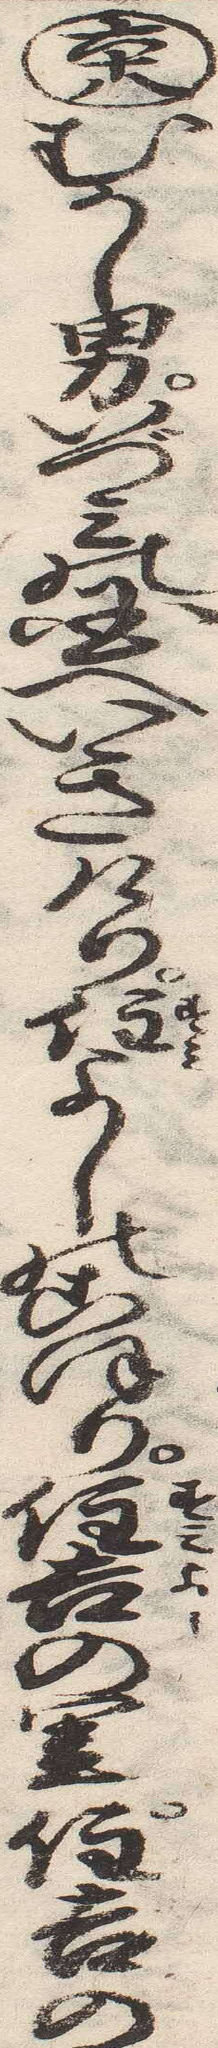六十八むかし男。いづみの国へいきけり。住よしのこほり。住吉の里。住吉の
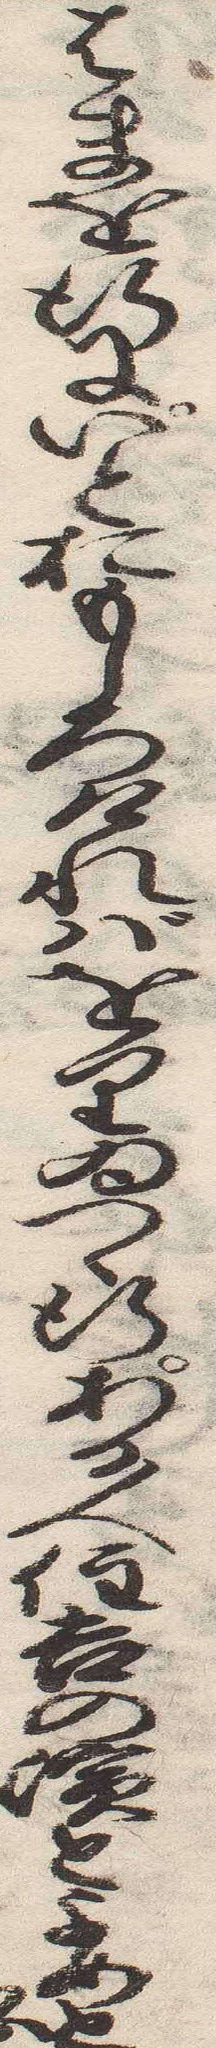はまを行に。いとおもしろければをりゐつゝ行。ある人住吉の浜とよめといふ
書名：伊勢物語
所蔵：東京学芸大学附属図書館 国文学研究資料館
